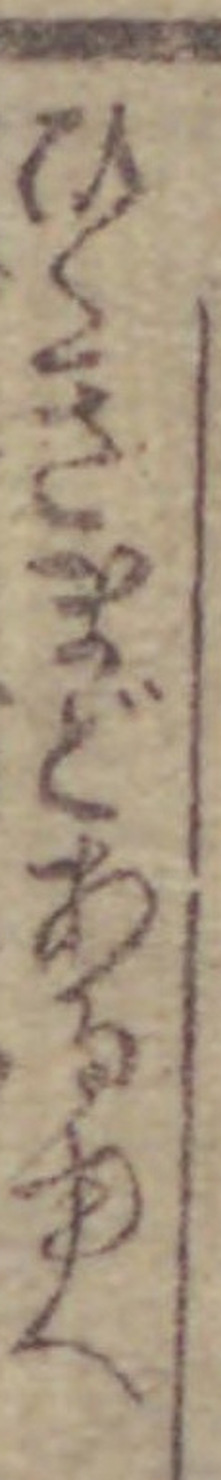ひくきまどあるゆへ
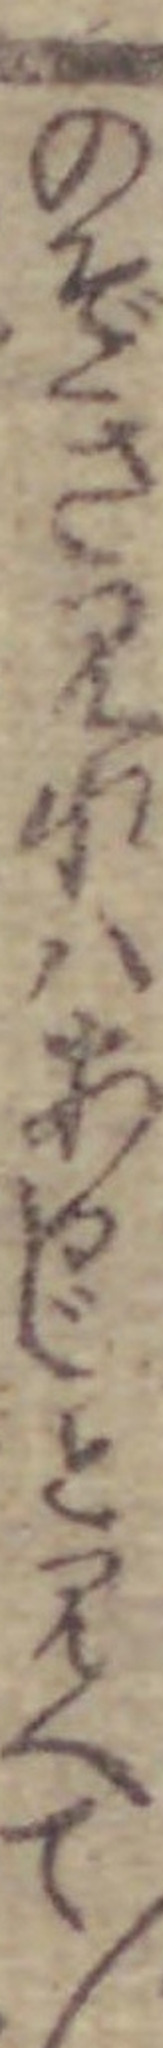のぞき見れはあるじと見へて
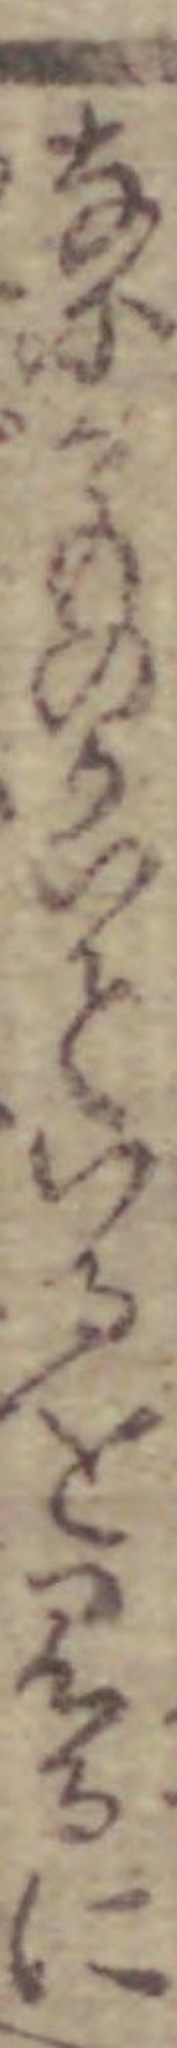なにかものかいているを見るに
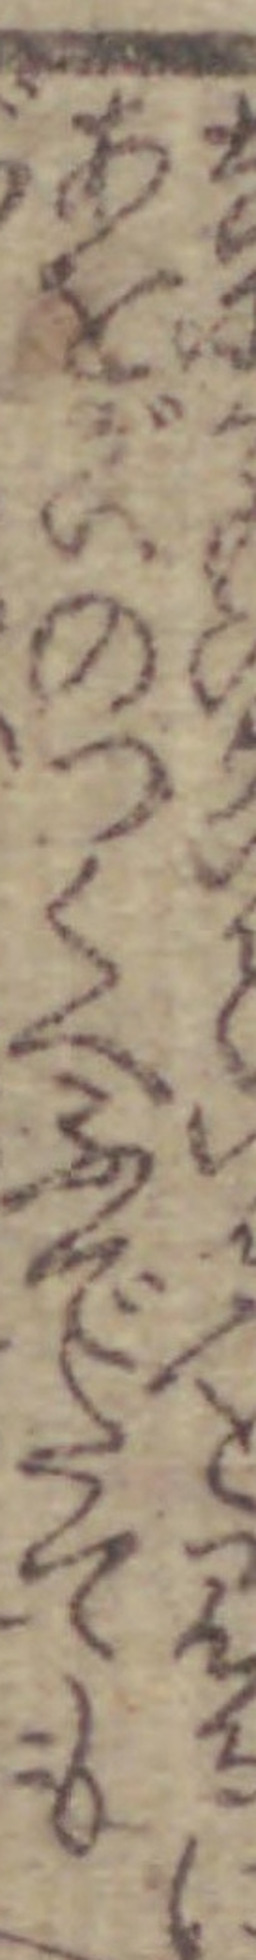あをがいのつくへふでたても
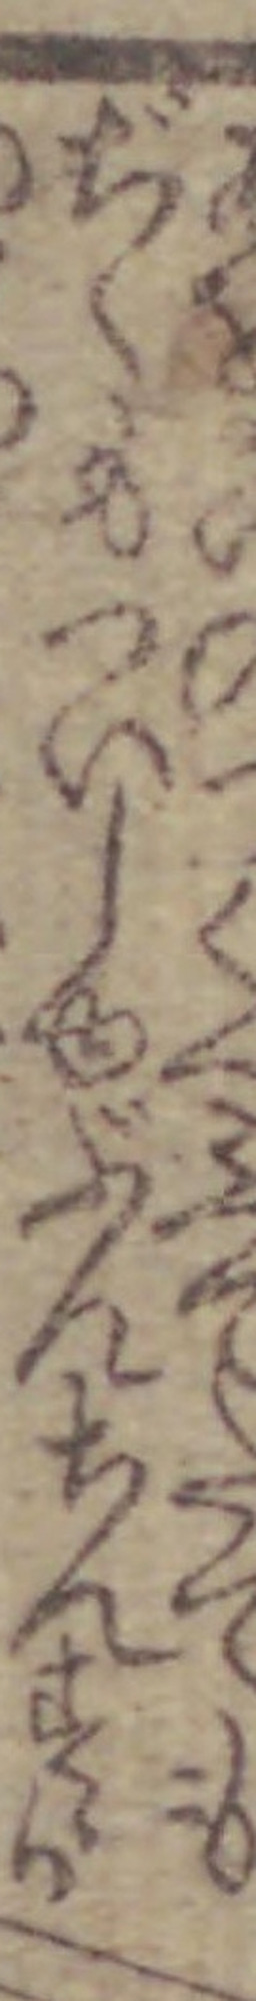ぢくもついしゆぶんちんすゝり
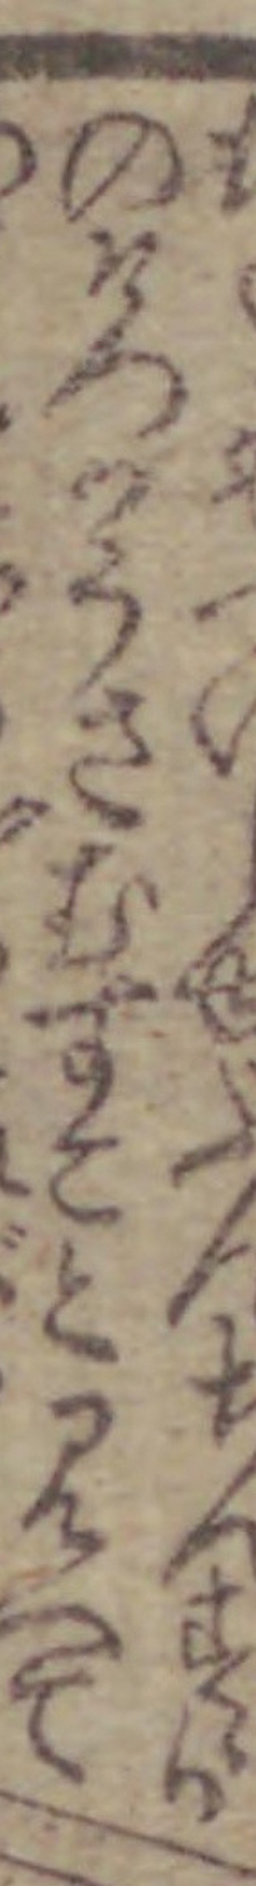のけつかうさむすこと見へて
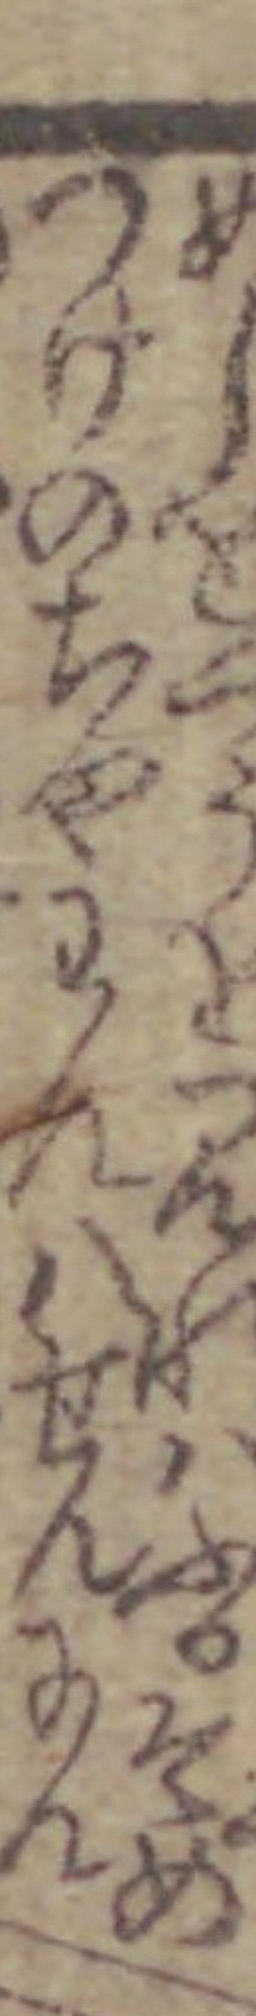つけのちやわん八せんにん
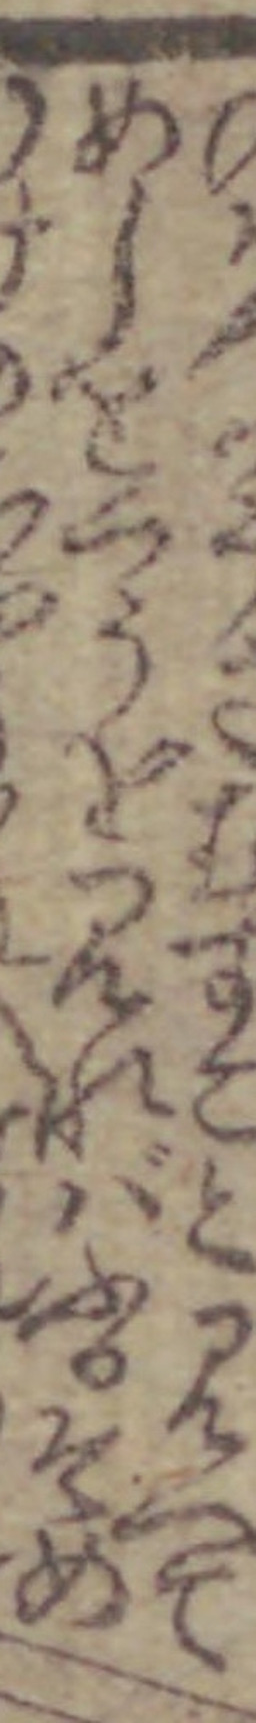めしをくうを見ればふかそめ
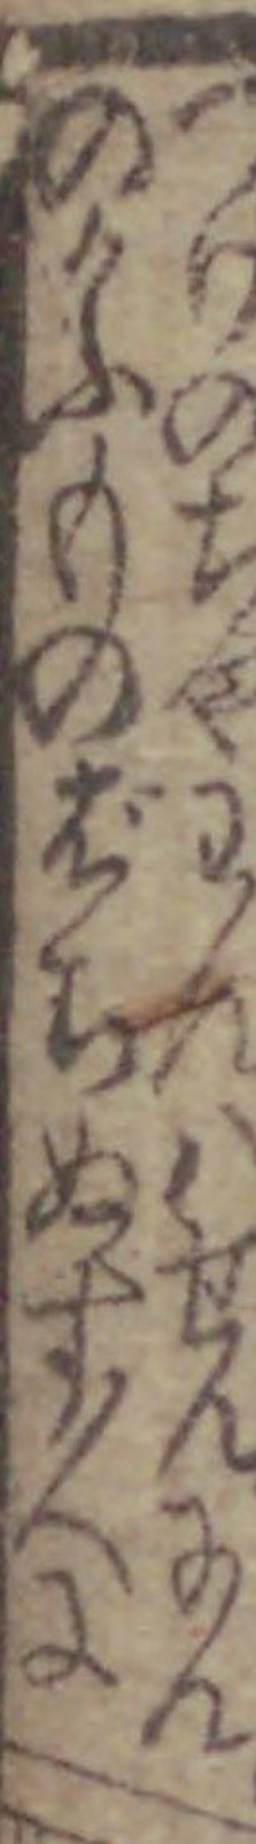のかふものばちぬす人に
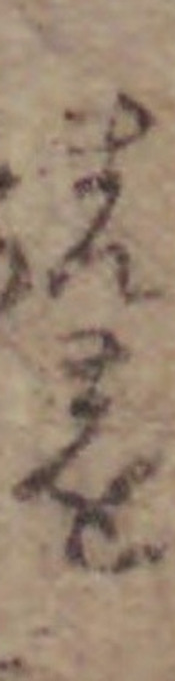まんまを
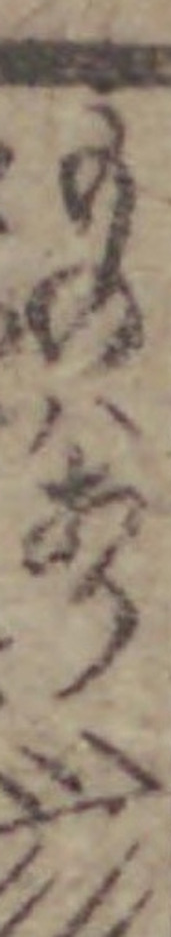ものはあり
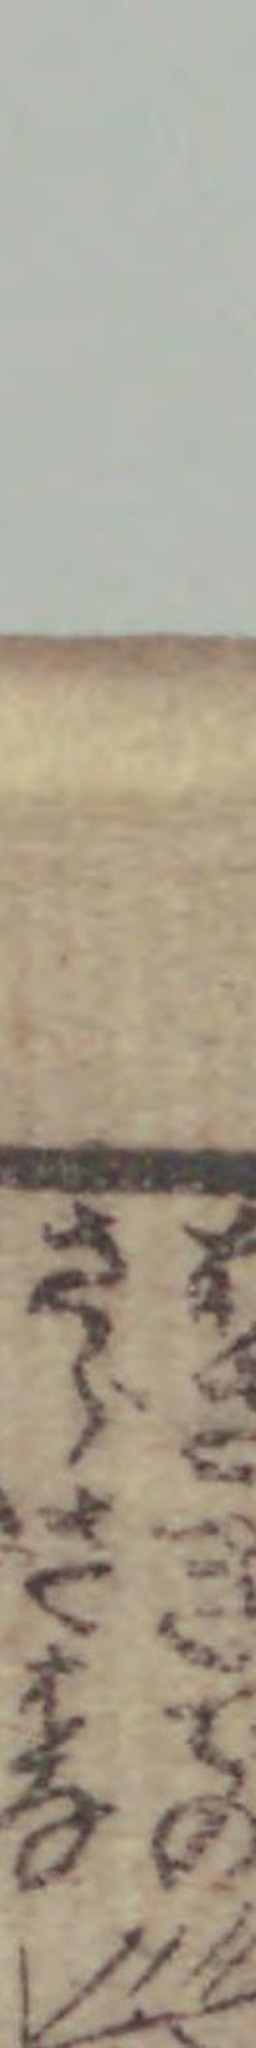さらさはな
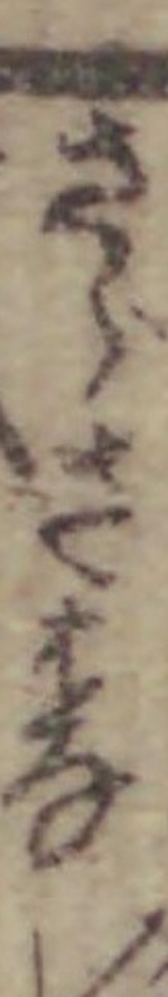さらさはな
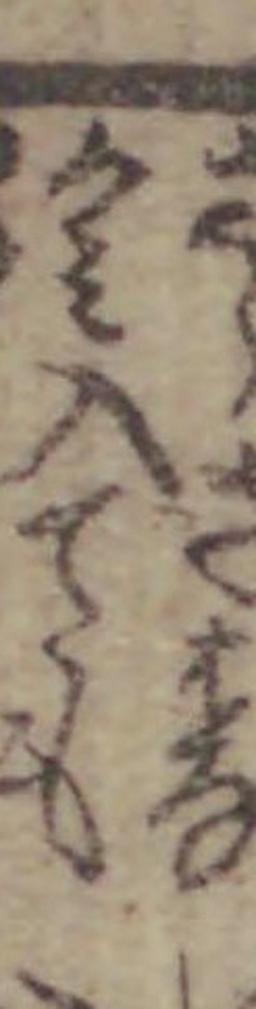かみ入ても
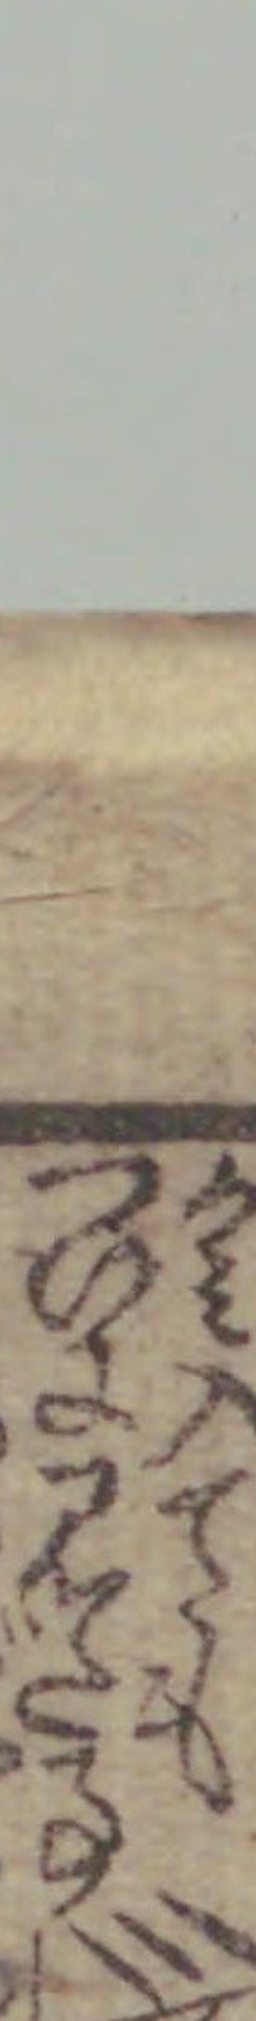ついに見た事
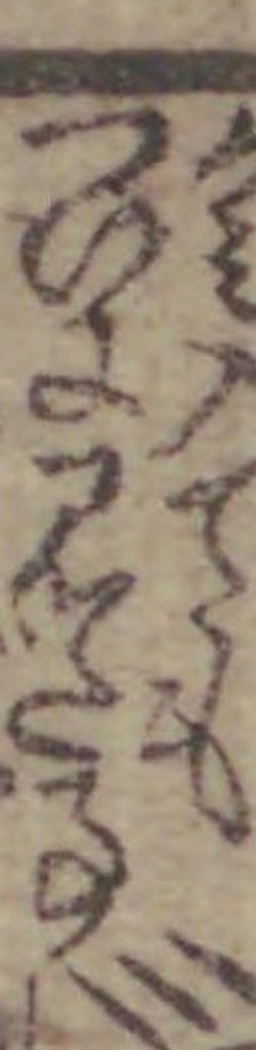ついに見た事
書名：近頃嶋めぐり 3巻
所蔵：国立国会図書館 National Diet Library, JAPAN
